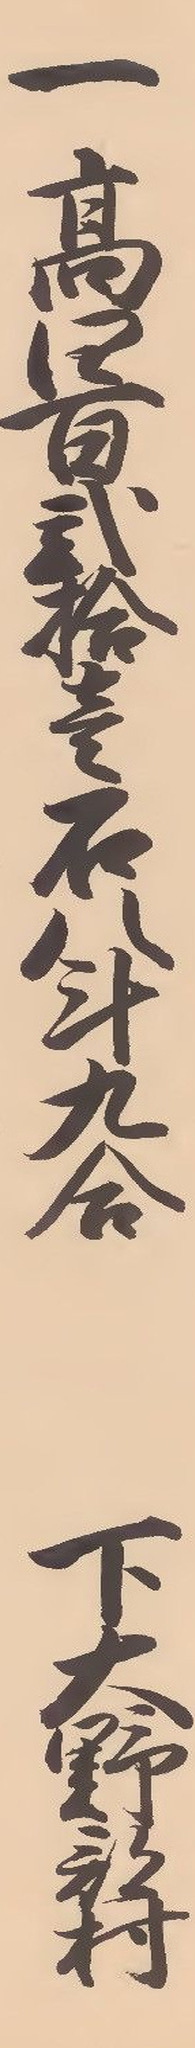一高四百弐拾壱石八斗九合下大野部村
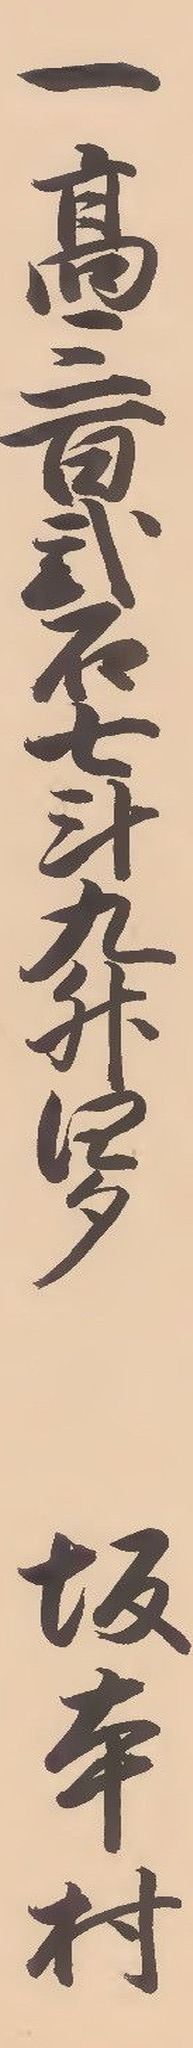一高三百弐石七斗九升四勺坂本村
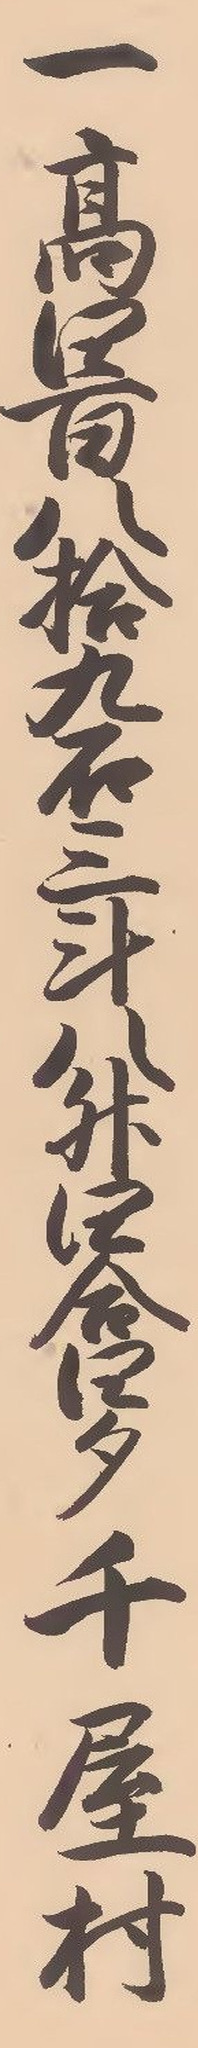一高四百八拾九石三斗八升四合四勺千屋村

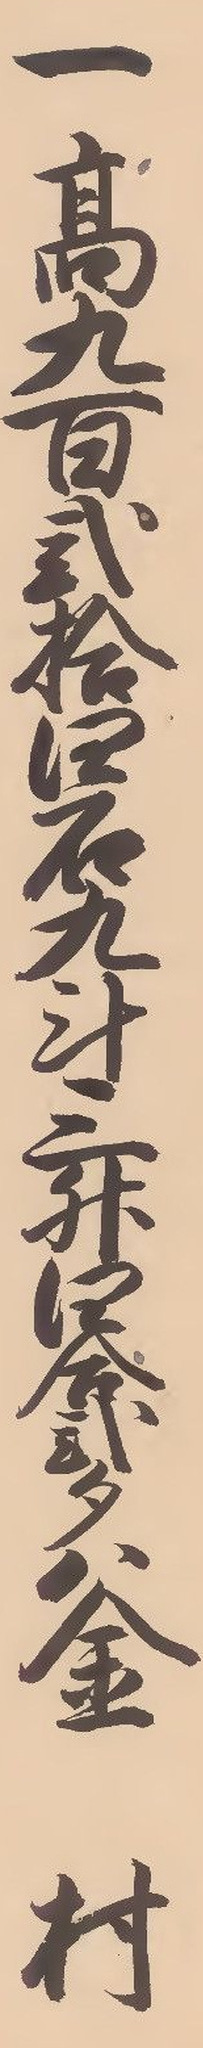一高九百弐拾四石九斗三升四合弐勺釜村
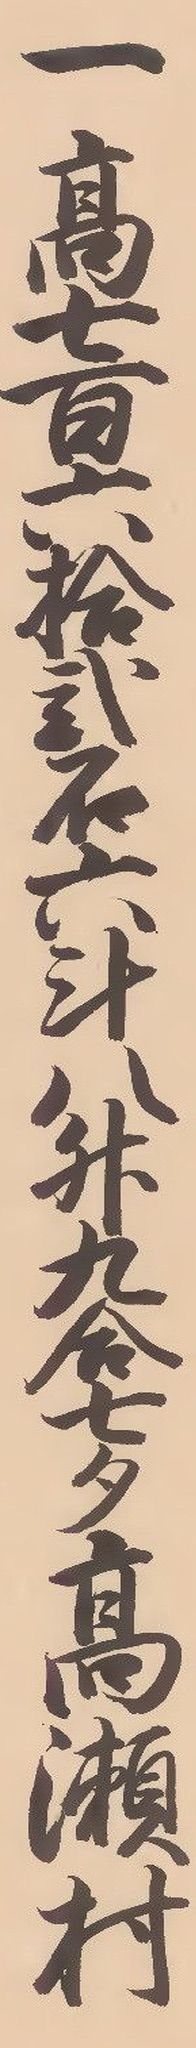一高七百六拾弐石六斗八升九合七勺高瀬村
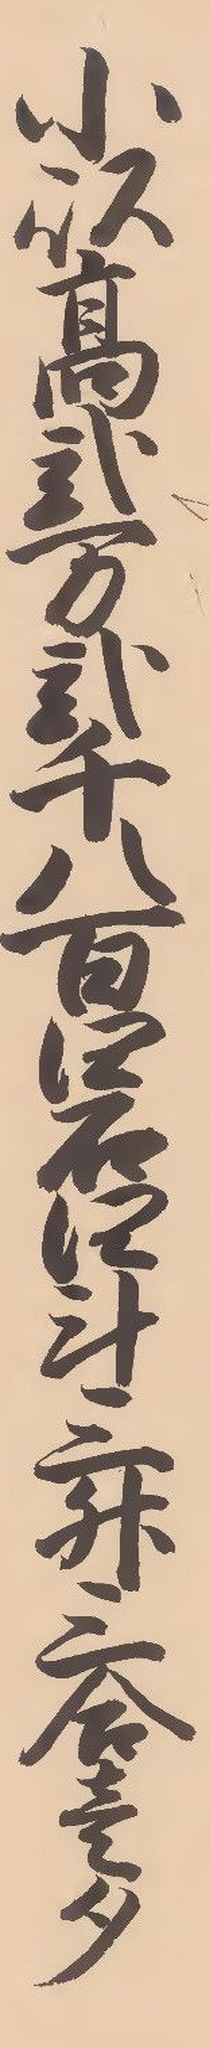小以高弐万弐千八百四石四斗三升三合壱勺
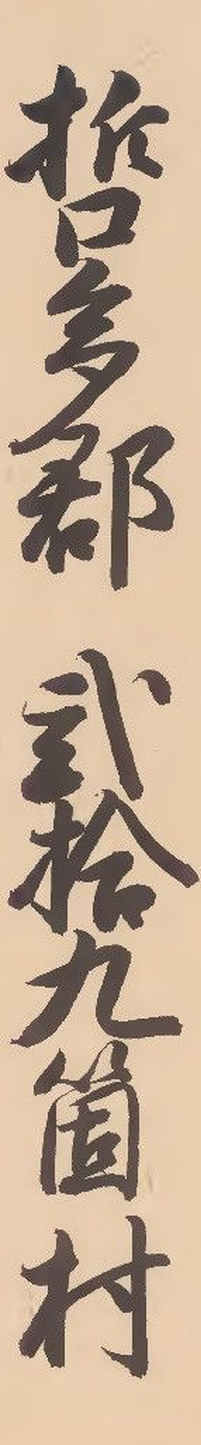哲多郡弐拾九箇村
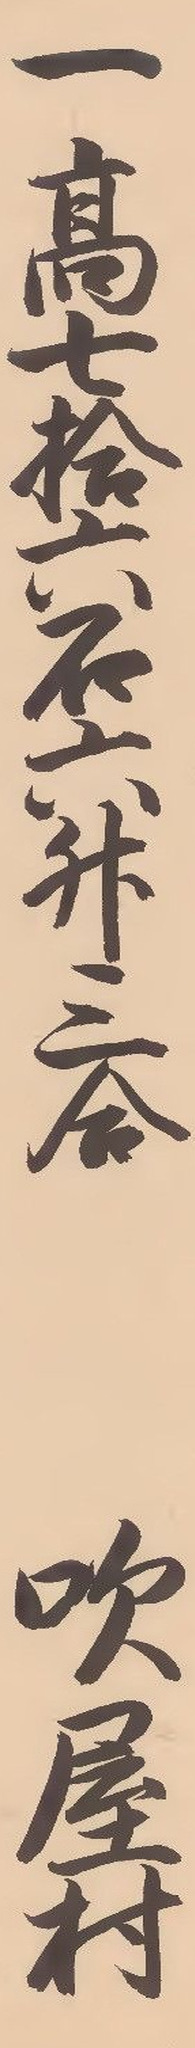一高七拾六石六升三合吹屋村
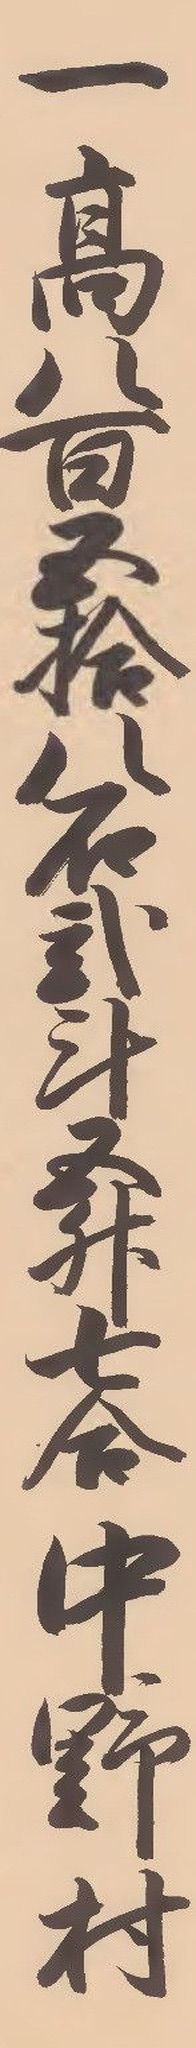一高八百五拾八石弐斗五升七合中野村
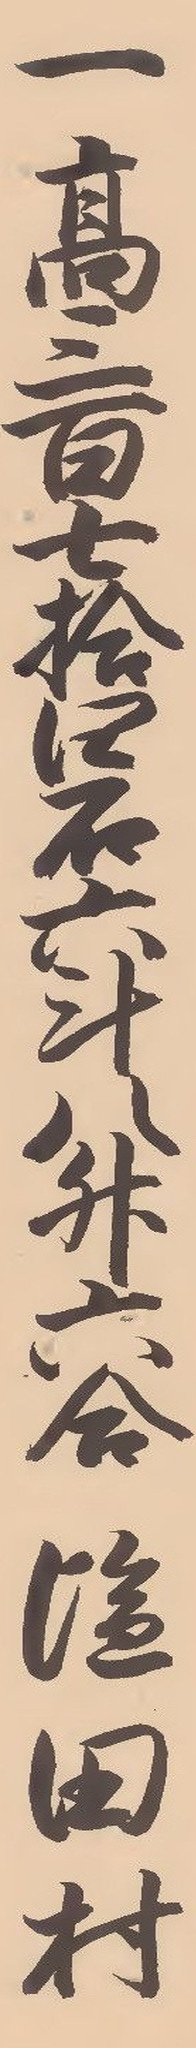一高三百七拾四石六斗八升六合塩田村

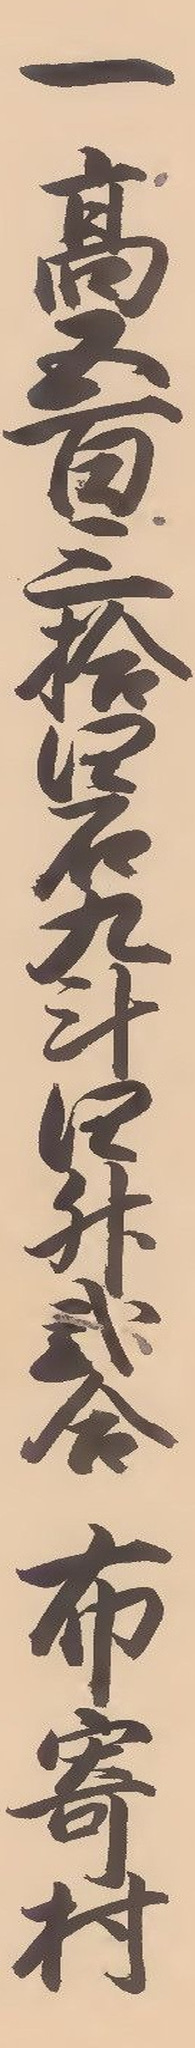一高五百三拾四石九斗四升弐合布寄村
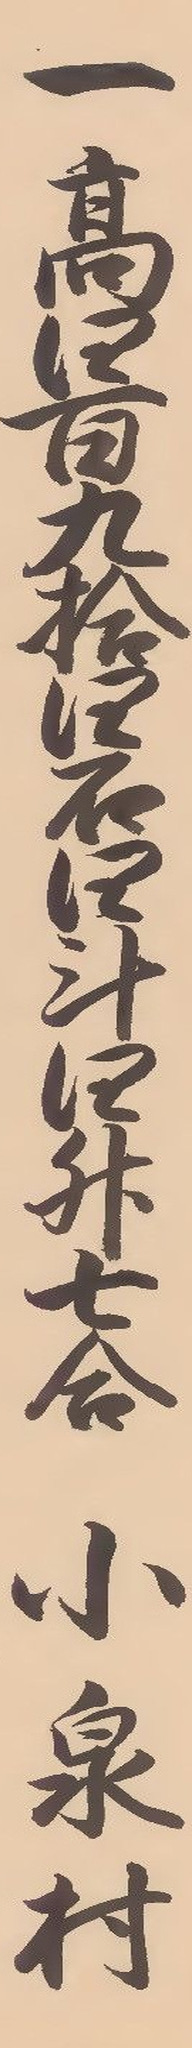一高四百九拾四石四斗四升七合小泉村
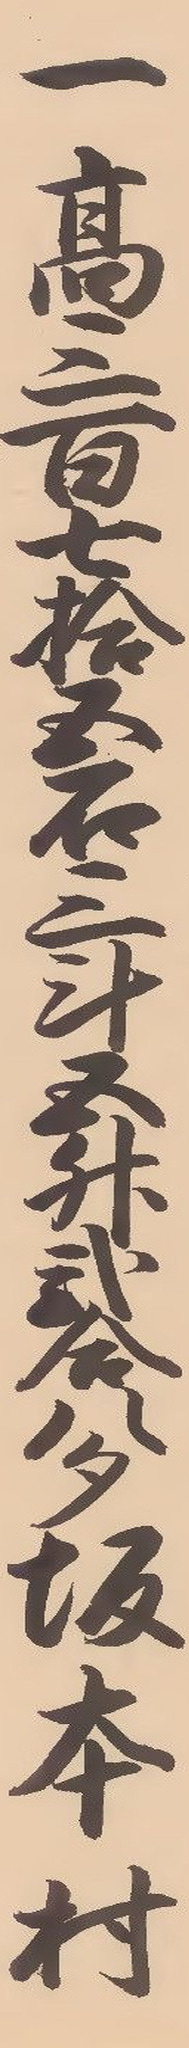一高三百七拾五石三斗五升弐合八勺坂本村
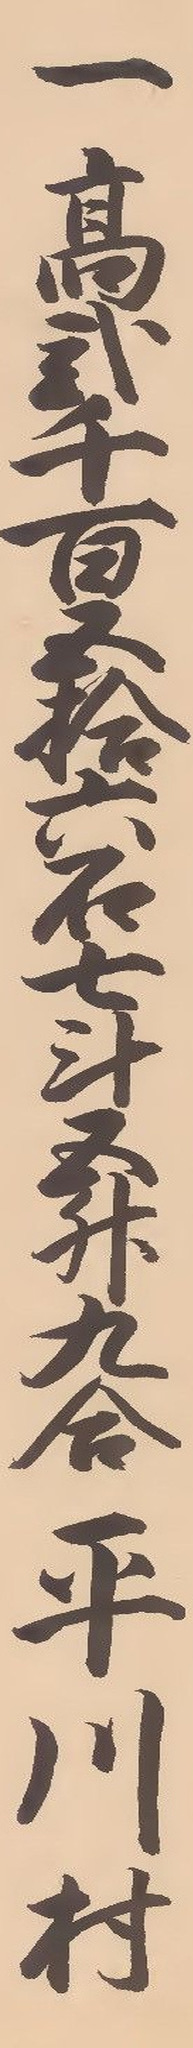一高弐千百五拾六石七斗五升九合平川村
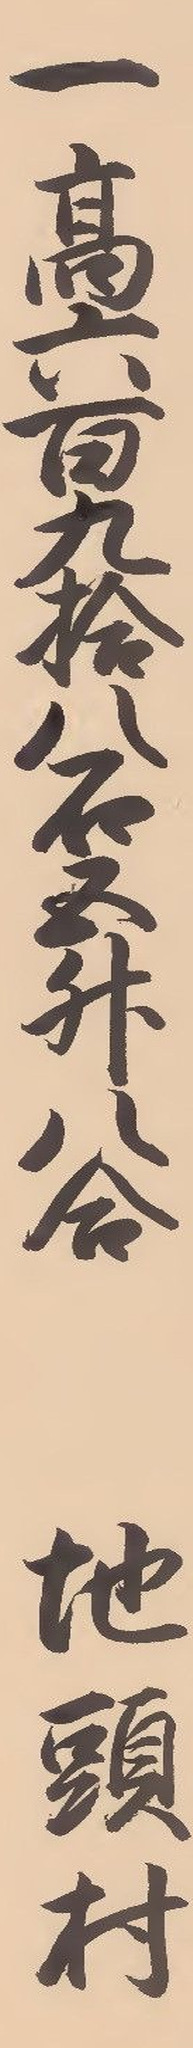一高六百九拾八石五升八合地頭村
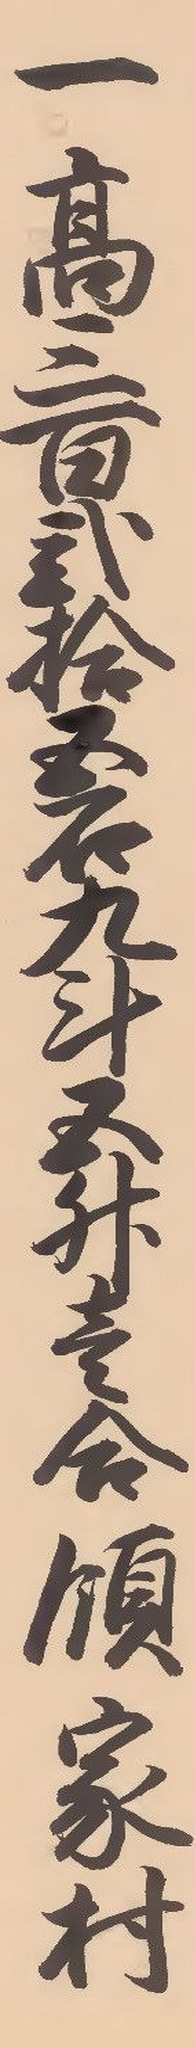一高三百弐拾五石九斗五升壱合領家村
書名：備中国郷帳
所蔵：国立公文書館 National Archives of Japan
